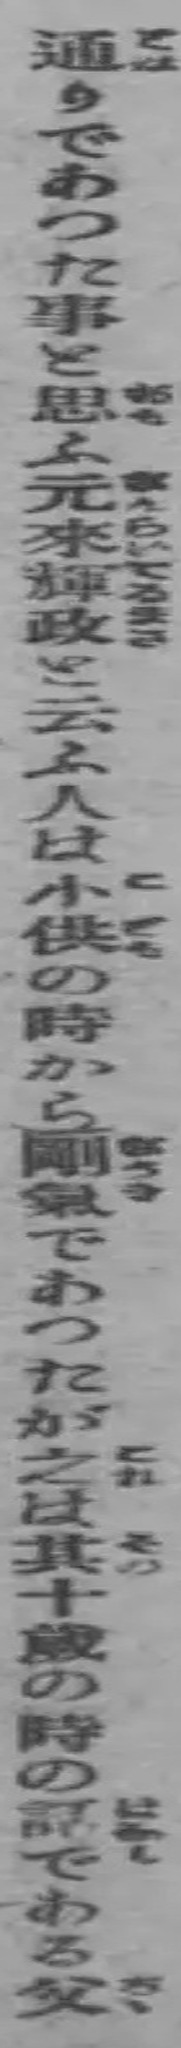輝政の幼時通りであつた事と思ふ元来輝政と云ふ人は小供の時から剛気であつたが之は其十歳の時の話である父
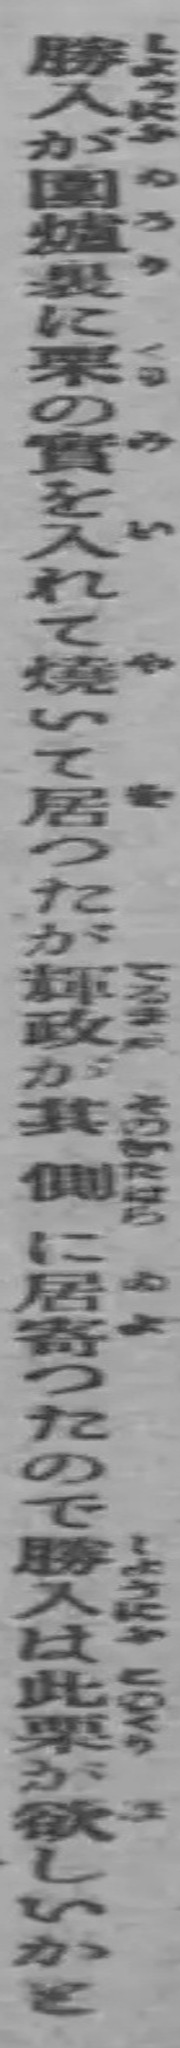勝入が囲炉裏に栗の実を入れて焼いて居つたが輝政が其側に居寄つたので勝入は此栗が欲しいかと
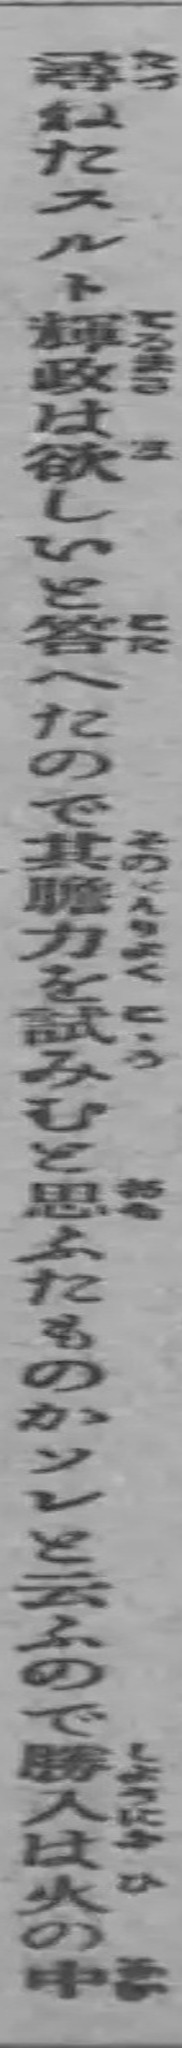尋ねたスルト輝政は欲しいと答へたので其胆力を試みむと思ふたものかソレと云ふので勝入は火の中
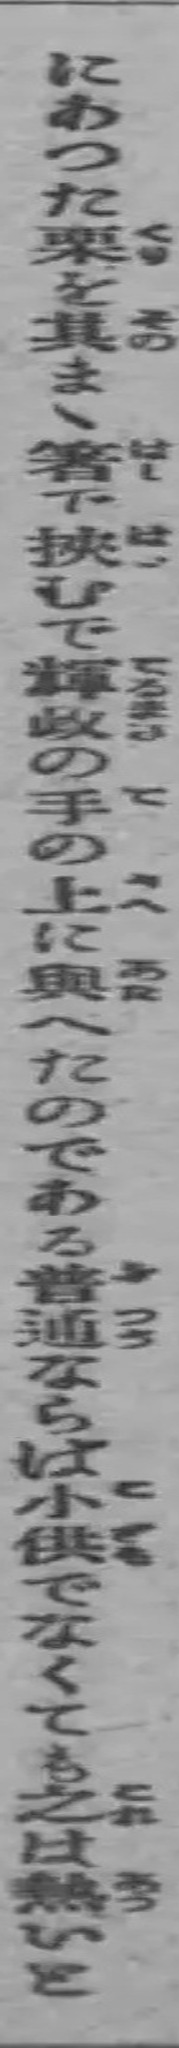にあつた栗を其まゝ箸で挟むで輝政の手の上に与へたのである普通ならば小供でなくても之は熱いと
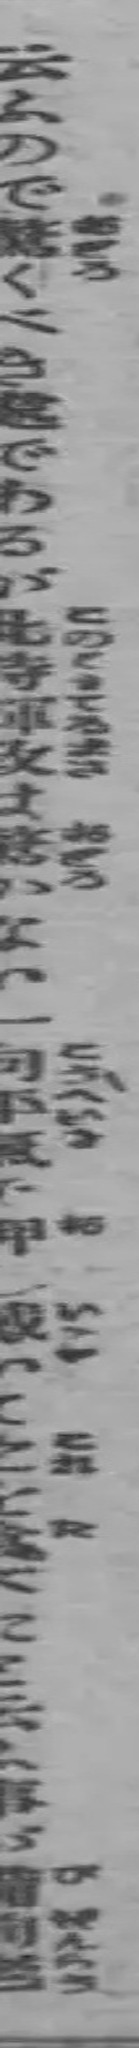云ふので驚くべき処であるが此時輝政は驚かない一向平気で押し戴いて之を食べたと云ふ事が備前老
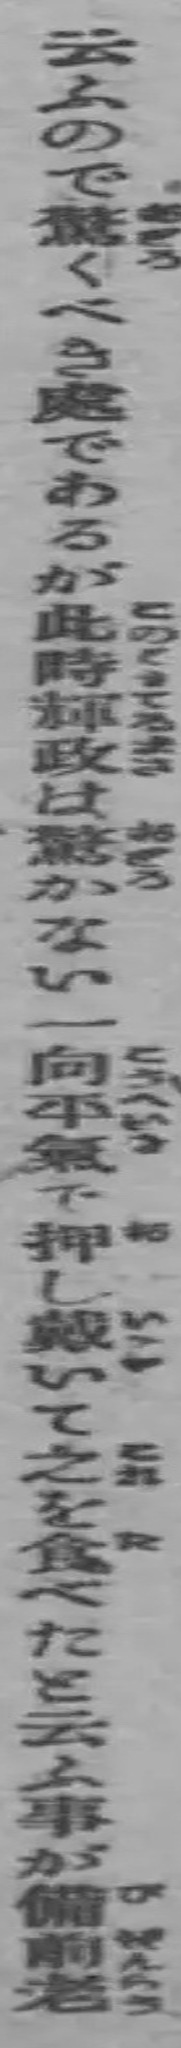云ふので驚くべき処であるが此時輝政は驚かない一向平気で押し戴いて之を食べたと云ふ事が備前老
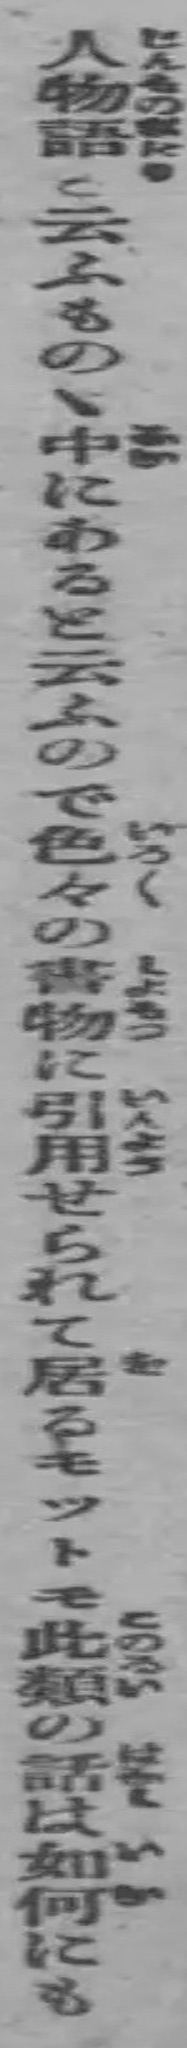人物語と云ふものゝ中にあると云ふので色々の書物に引用せられて居るモツトモ此類の話は如何にも
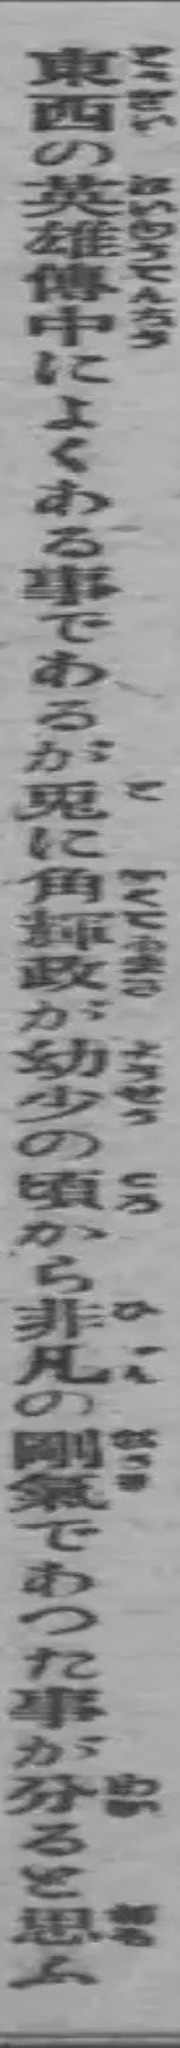東西の英雄伝中によくある事であるが兎に角輝政が幼少の頃から非凡の剛気であつた事が分ると思ふ
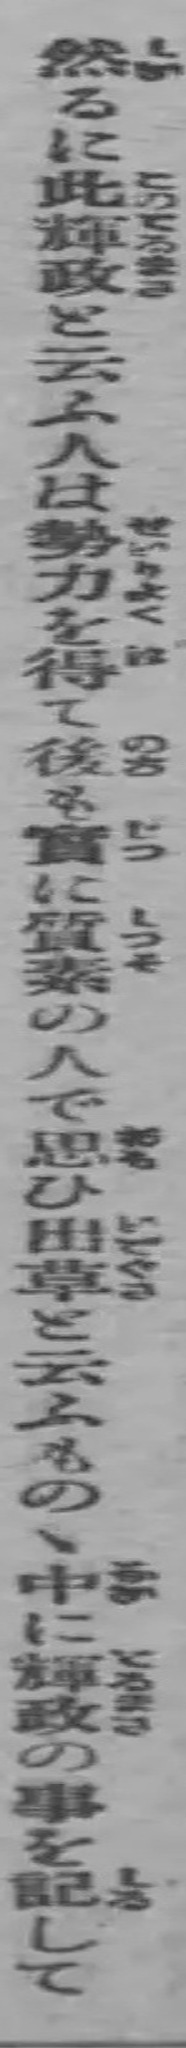輝政の質素然るに此輝政と云ふ人は勢力を得て後も実に質素の人で思ひ出草と云ふものゝ中に輝政の事を記して
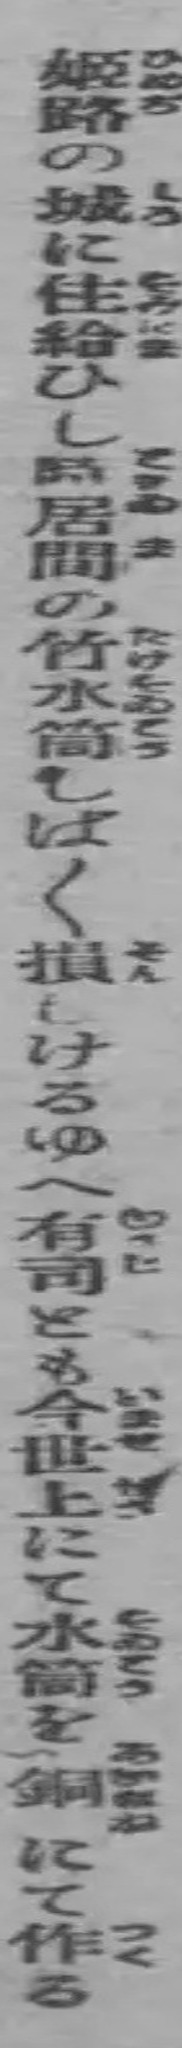姫路の城に住給ひし時居間の竹水筒しば〳〵損しけるゆへ有司とも今世上にて水筒を銅にて作る
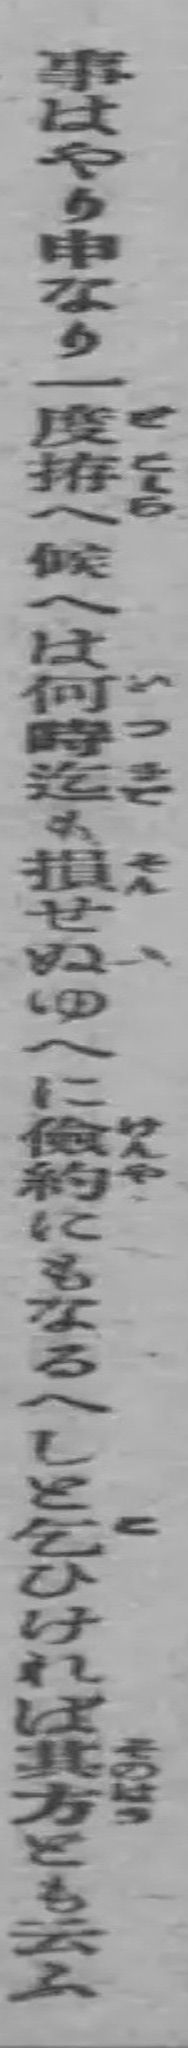事はやり申なり一度拵へ候へは何時迄も損せぬゆへに倹約にもなるへしと乞ひければ其方とも云ふ
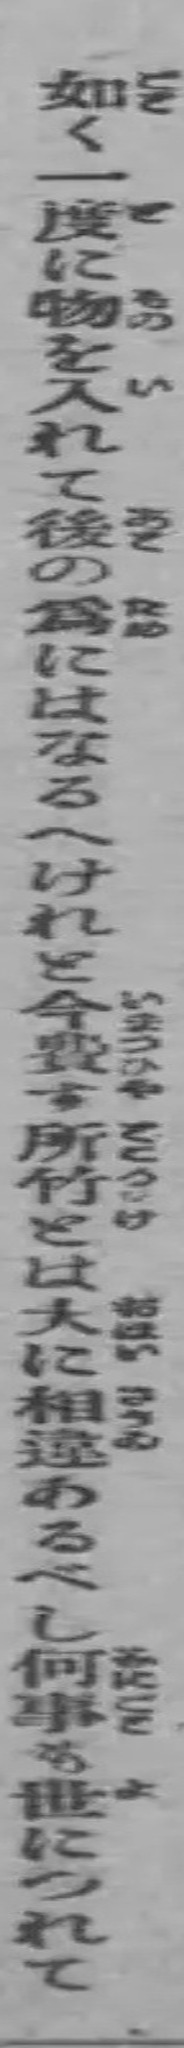如く一度に物を入れて後の為にはなるへけれと今費す所竹とは大に相違あるべし何事も世につれて
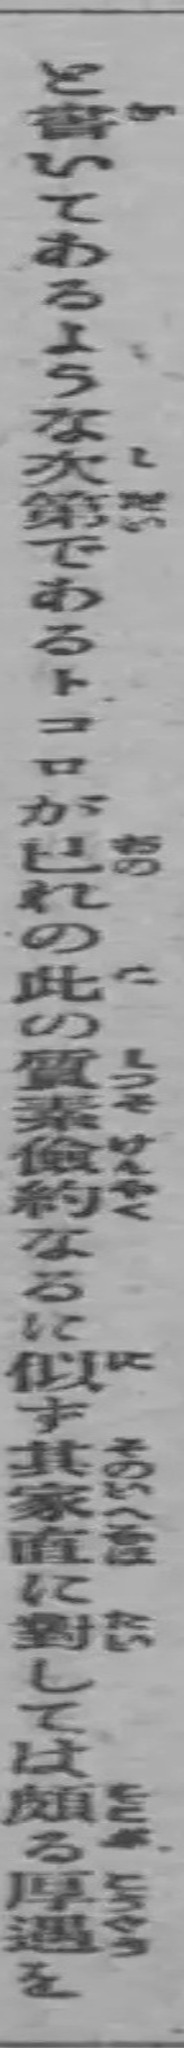と書いてあるような次第であるトコロが巳れの此の質素倹約なるに似ず其家直に対しては頗る厚遇を
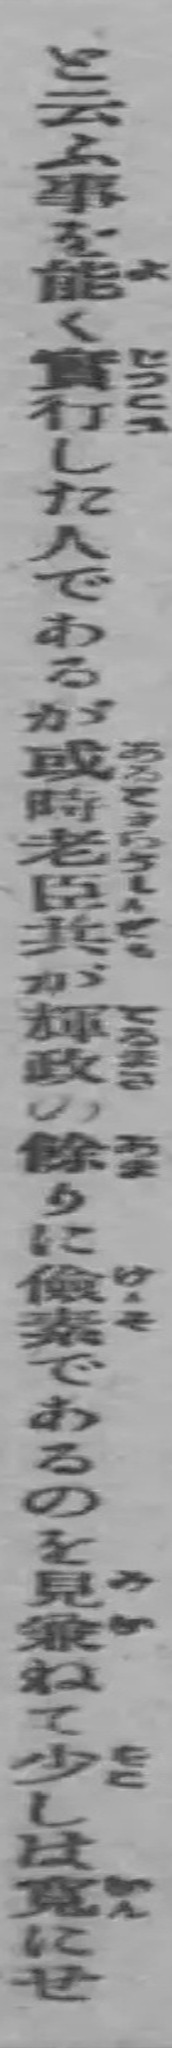と云ふ事を能く実行した人であるが或時老臣共が輝政の余りに倹素であるのを見兼ねて少しは寛にせ
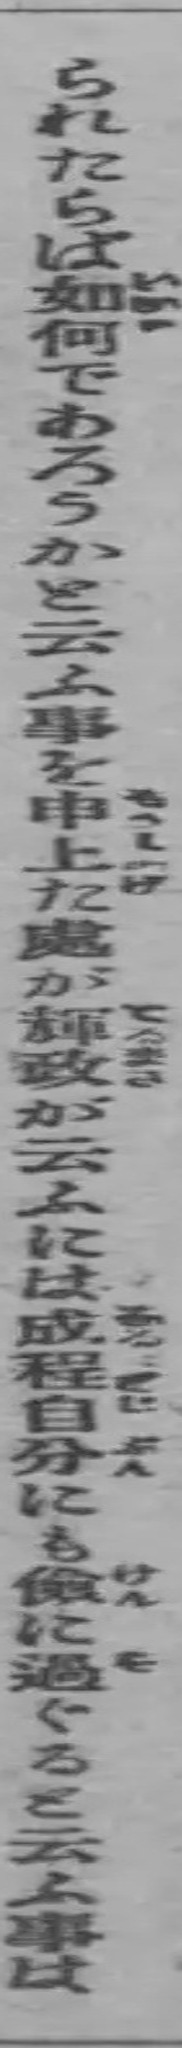られたらば如何であろうかと云ふ事を申上た処が輝政が云ふには成程自分にも倹に過ぐると云ふ事は
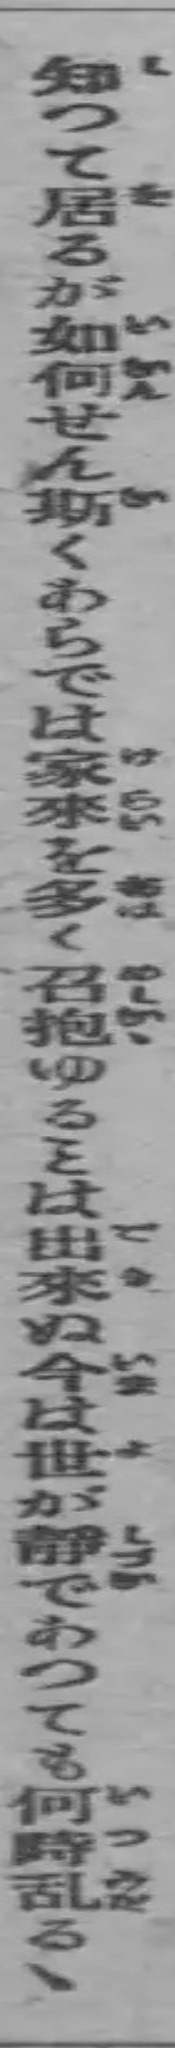知つて居るが如何せん斯くあらでは家来を多く召抱ゆることは出来ぬ今は世が静であつても何時乱るゝ
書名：豊橋市史談
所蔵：国立国会図書館 National Diet Library, JAPAN
